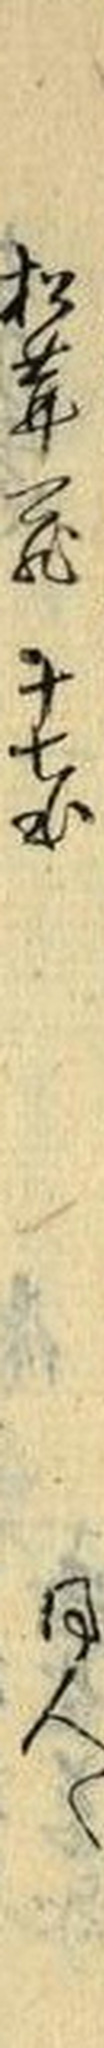松茸一籠十七本同人へ
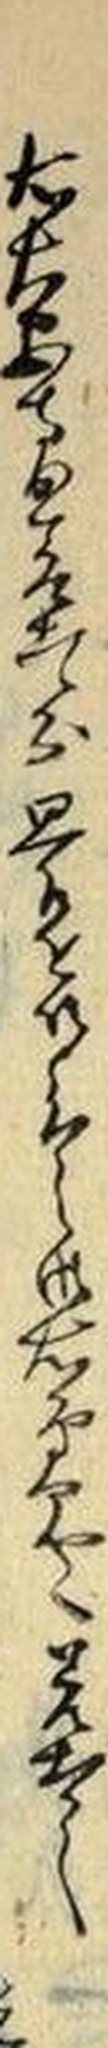右大安寺ゟ差出候分思召を以被下之御右筆部やへ差出之
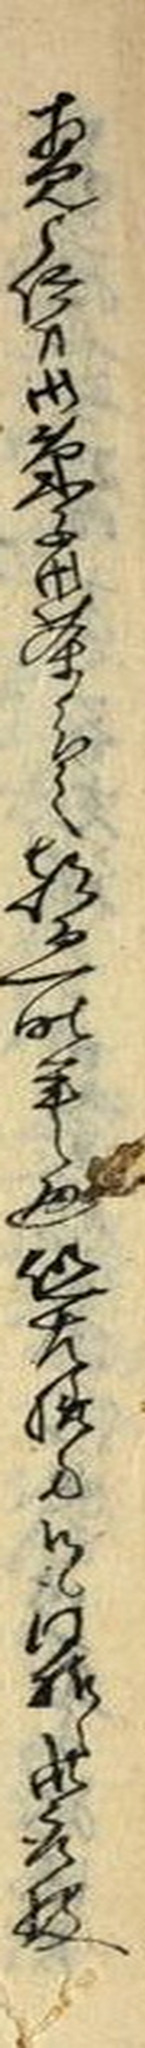拝見被仰付御菓子御茶被下之都而一昨年之通但左膳方江も同様御取扱
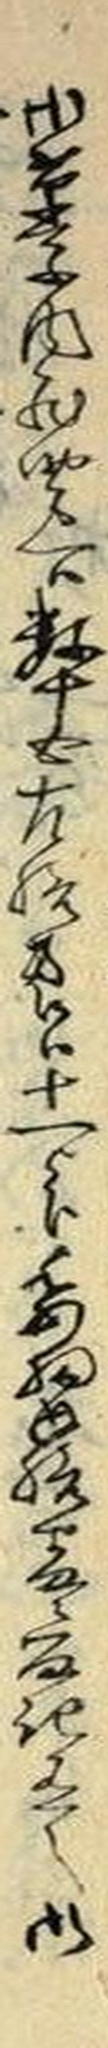御菓子内蔵助方へハ数十五左膳方江ハ十一被下委細御膳番ニ留記有之御
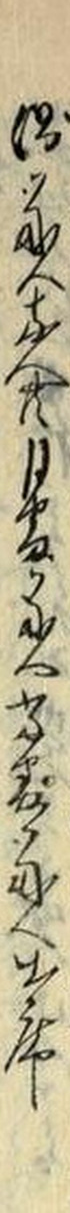側御用人両人共月番御用人当番御用人出席
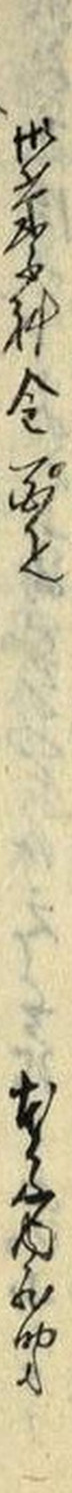御菓子料金百疋本多内蔵助方
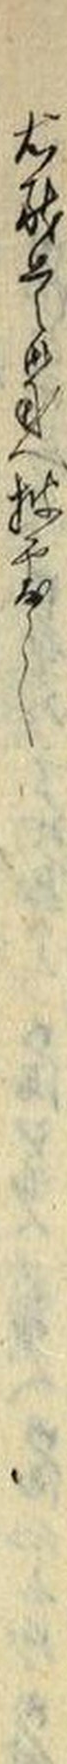右献上之御用人披露之
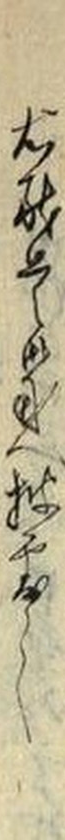右献上之御用人披露之
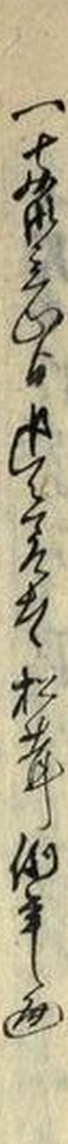一両御立山ゟ追々差出候松茸例年之通
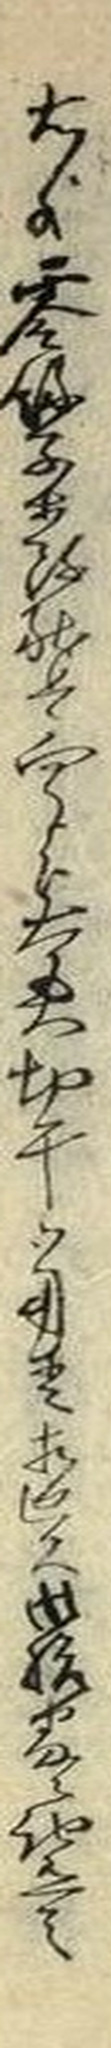右之外零餘子等致献上候向へ被下大奥切干御用等ニ相廻ス御膳番ニ記有之
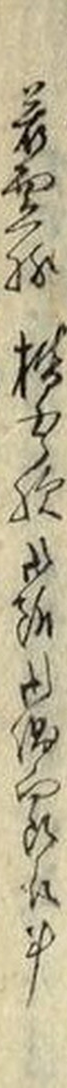若殿様揩五郎様御附御側向頭取斗
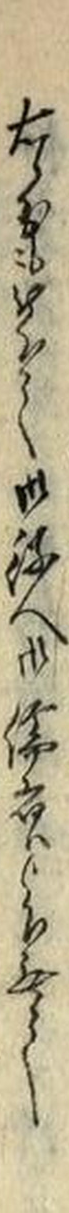右之分も被下之御役人御儒者ハ被下無之
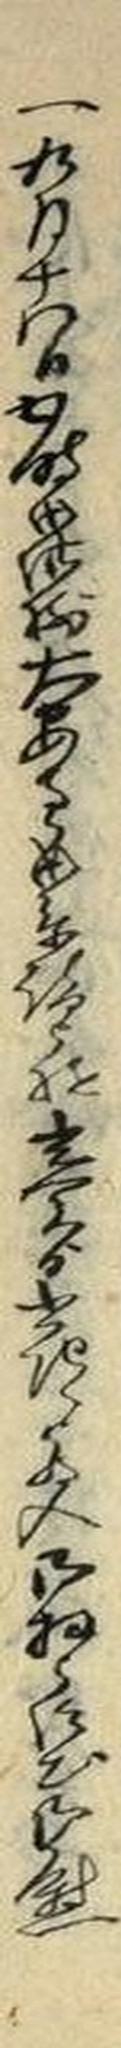一九月十八日五時御供揃大安寺へ御参詣被遊玄関ゟ書院へ被為入御拝被仰出御熨

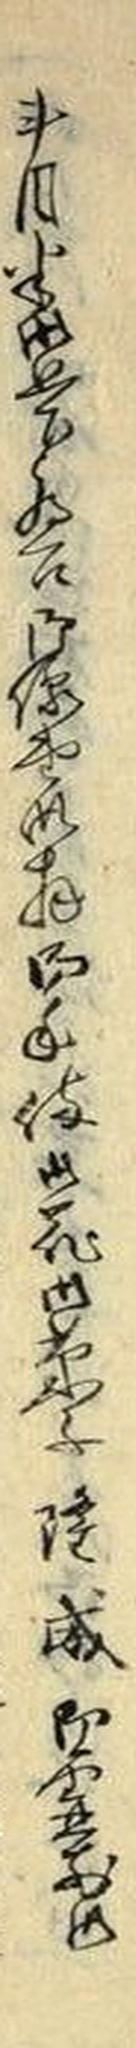斗目半御上下被為召御像堂御拝御手備御花御菓子隆威御霊前御
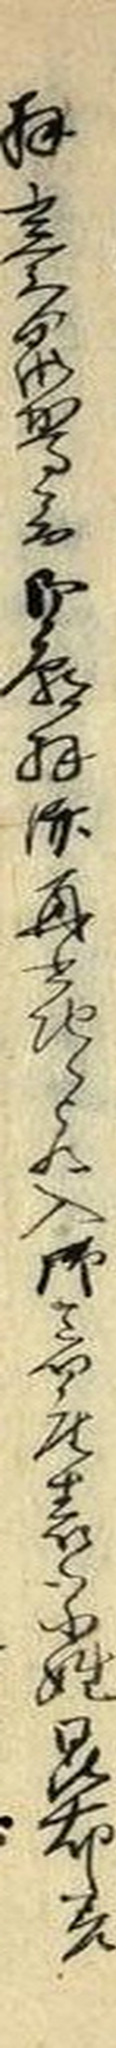拝玄関ゟ御駕ニ而御廟拝済再書院へ被為入御着座表御小姓昆布差
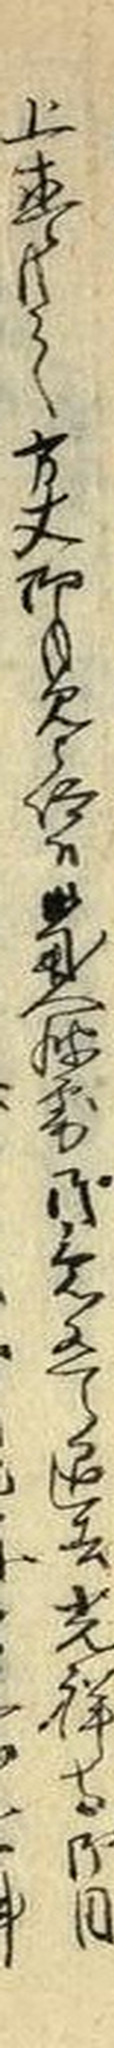上直ニ引之方丈御目見被仰付御用人披露御意有之退去光祥寺御目
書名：少傅日録抄（斉承付側向頭取日記、在国）
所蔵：福井県文書館 Fukui Prefectural Archives
